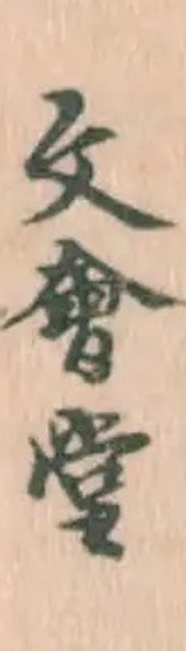文會堂
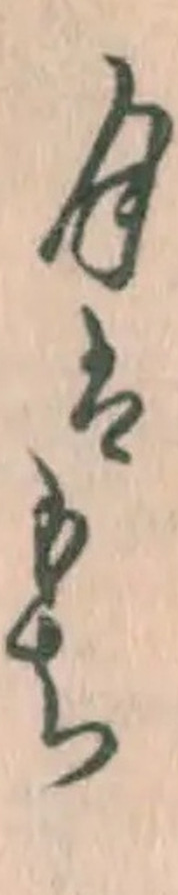月はもち
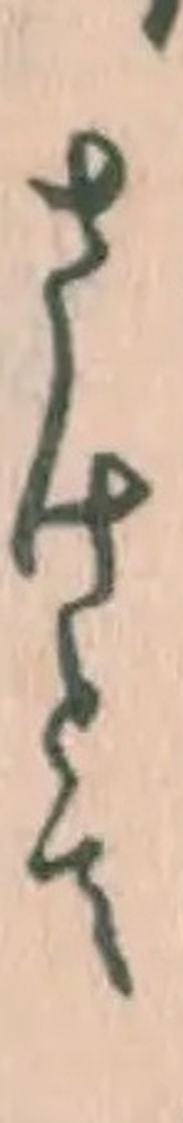さけとて
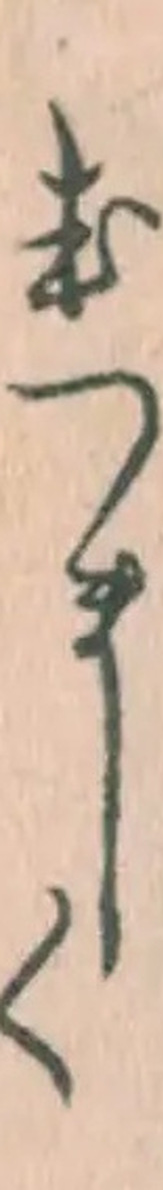むつましく
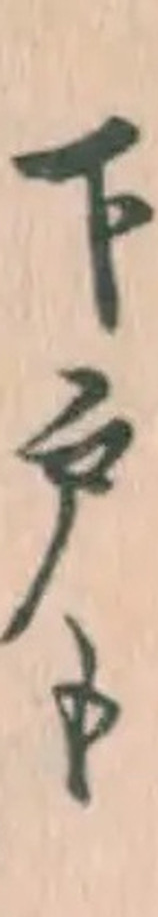下戸も
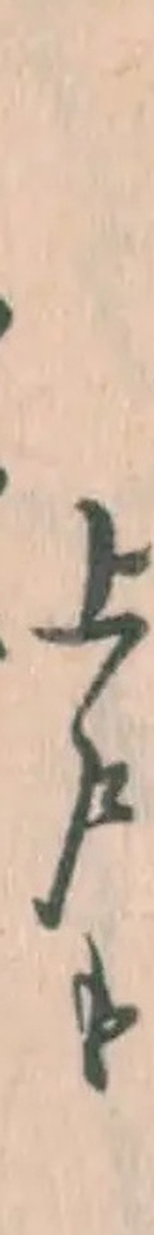上戸も
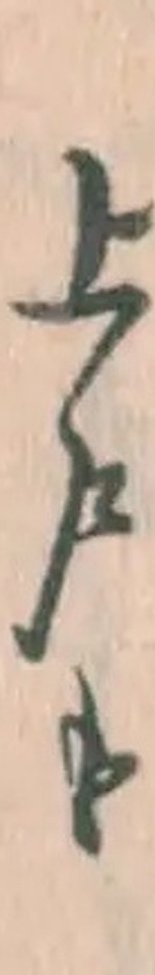上戸も
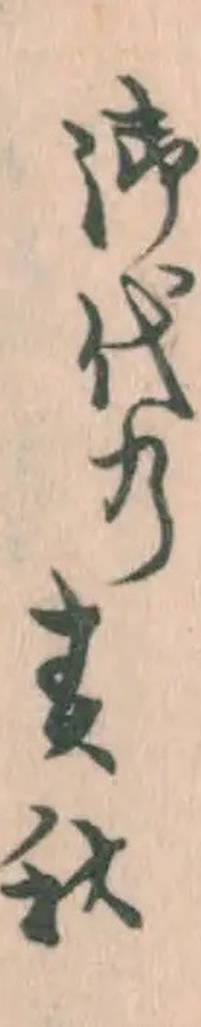御代の春秋
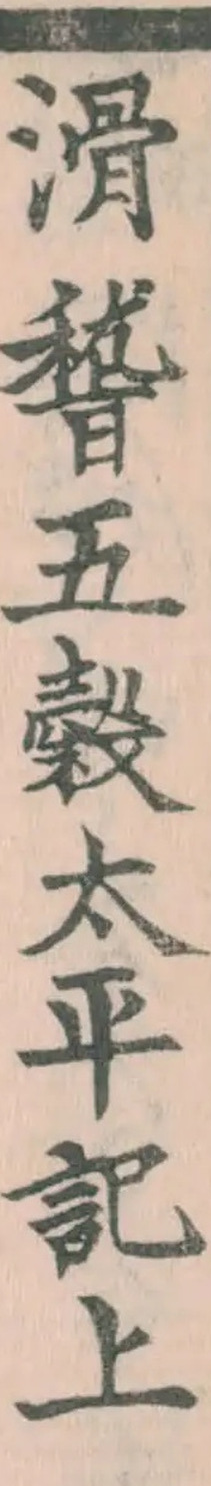滑稽五穀太平記上
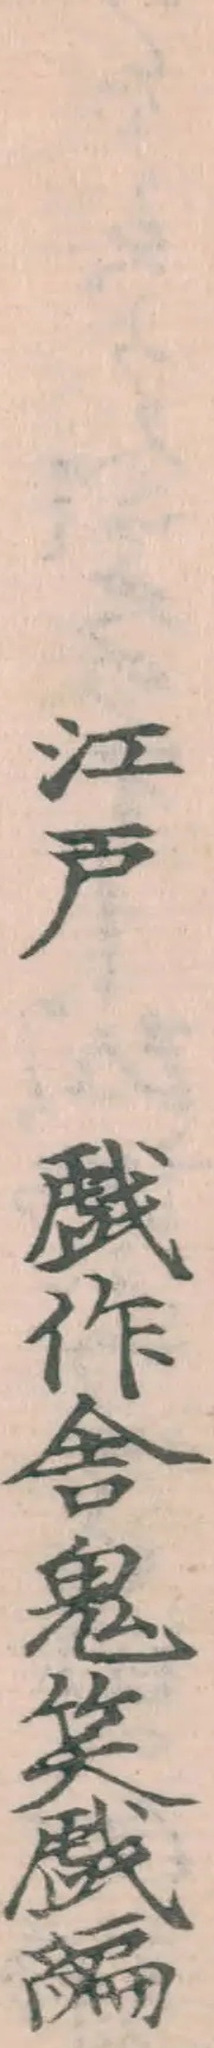江戸戯作舎鬼笑戯編
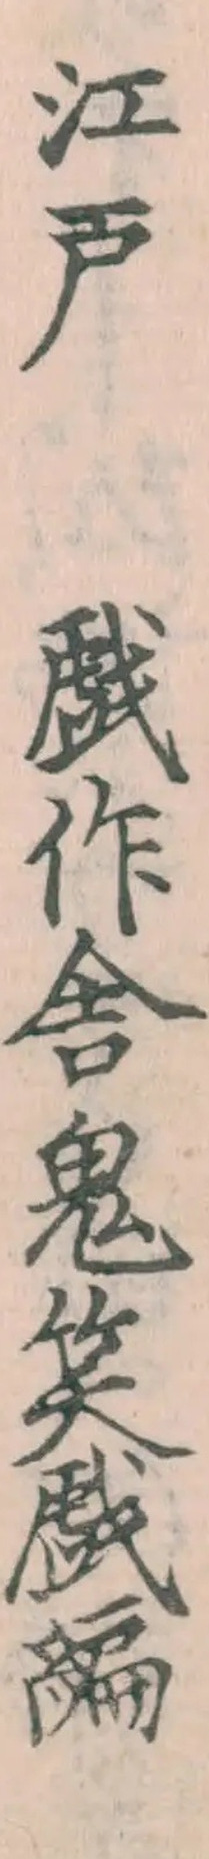江戸戯作舎鬼笑戯編
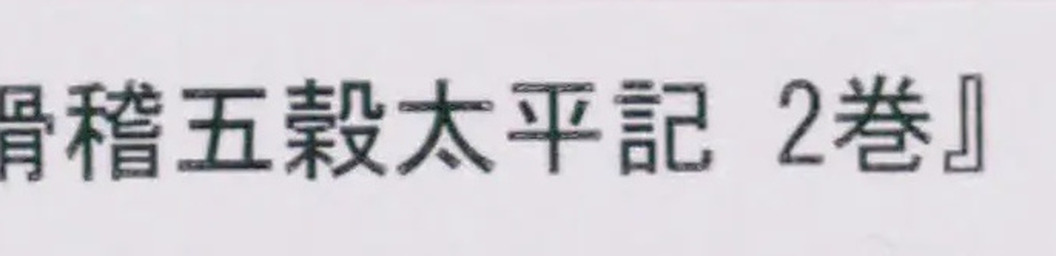滑稽五穀太平記上
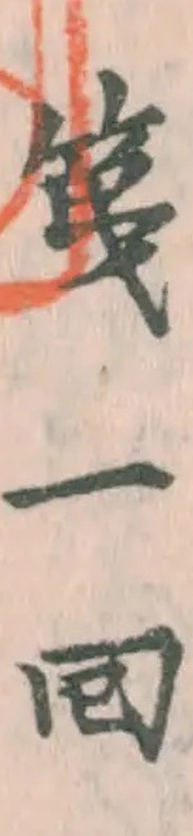第一回
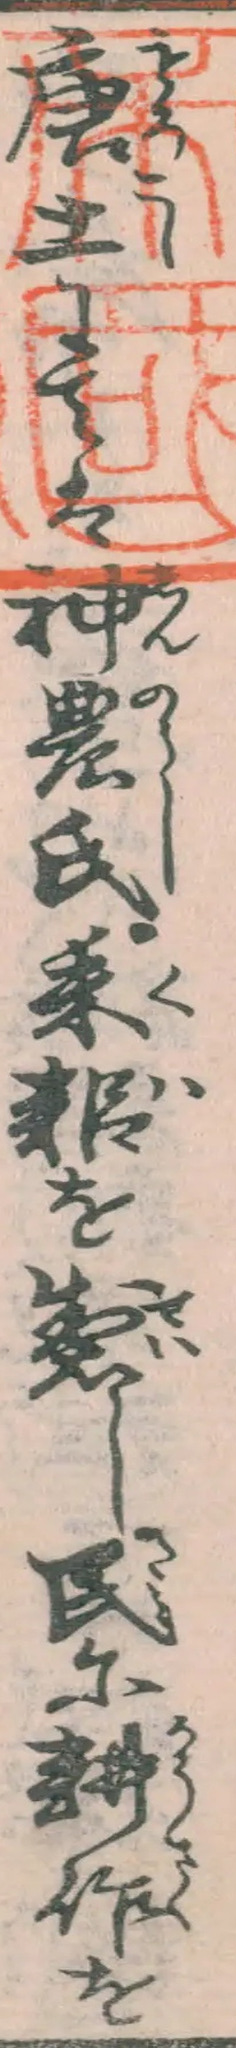唐土にては神農氏。桒雑を製し民に耕作を
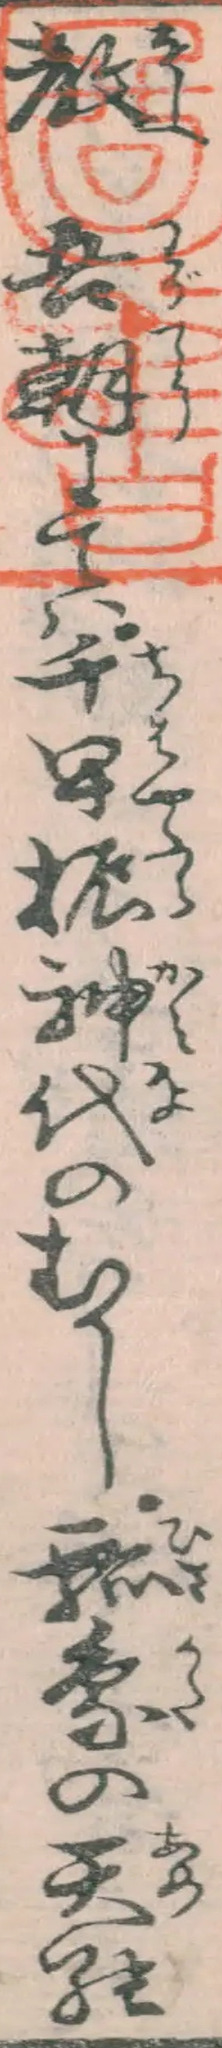教吾朝にては。千早振神代のむかし。無象の天の
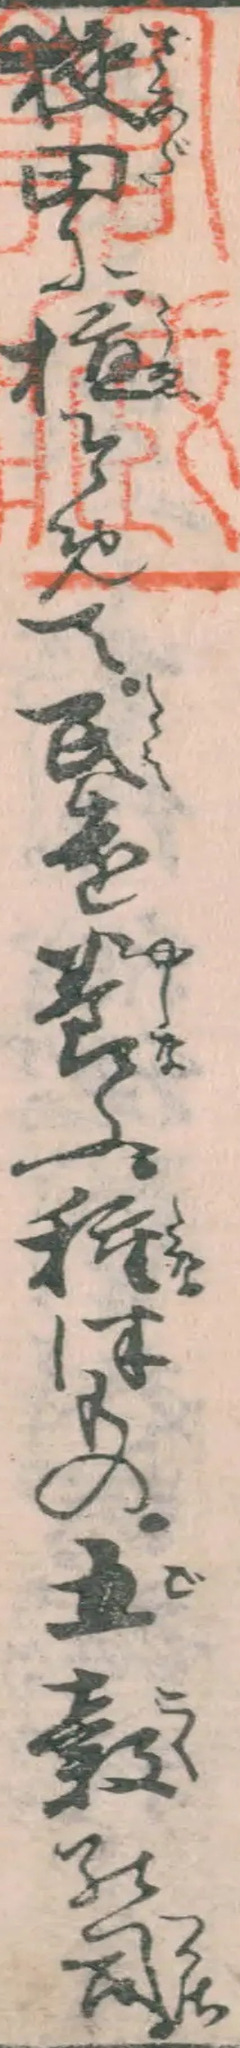枚田に。植そめて。民たを養ふ種つもの。五穀の司。
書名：滑稽五穀太平記 2巻
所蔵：国立国会図書館 National Diet Library, JAPAN
